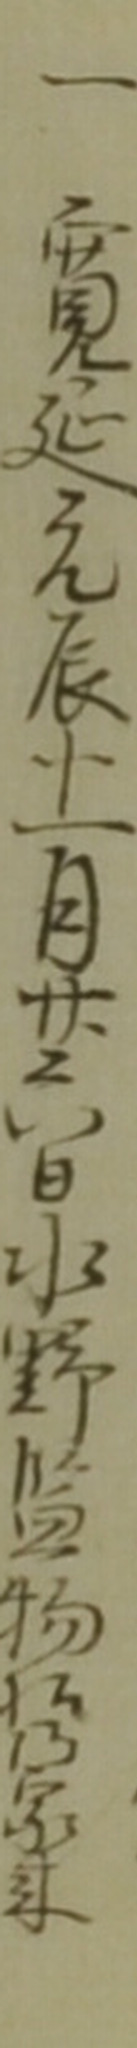一寛延元辰十一月廿六日水野監物様御家来
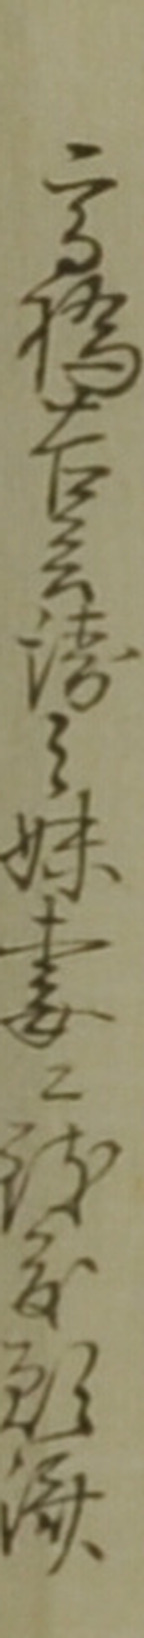高橋吉兵衛之妹妻致度願済
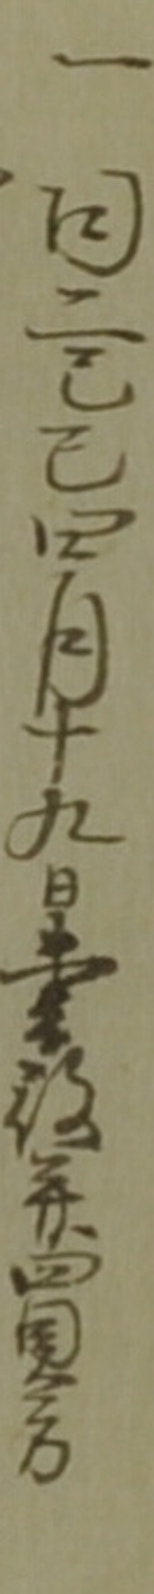一同二己巳四月十九日書役并買方
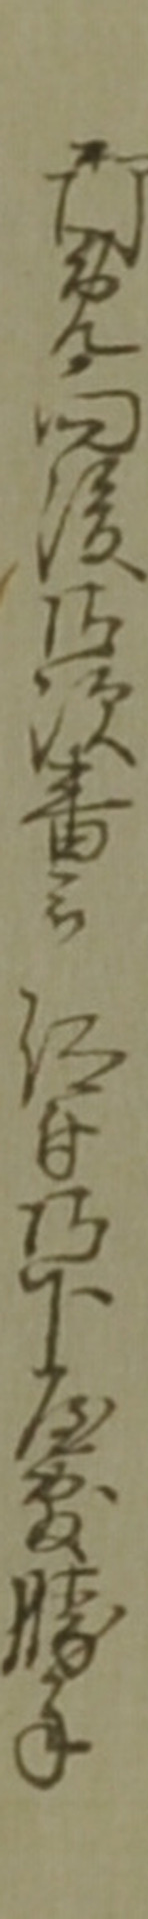御免向後御次番被仰付御下屋敷勝手
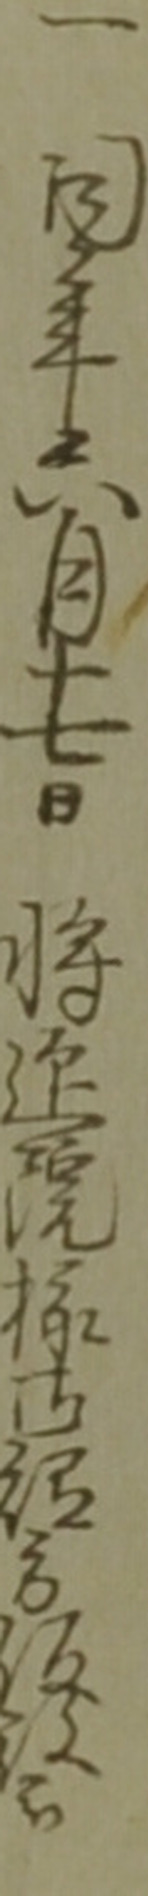一同年六月十七日将迎院様御賄方仮役被
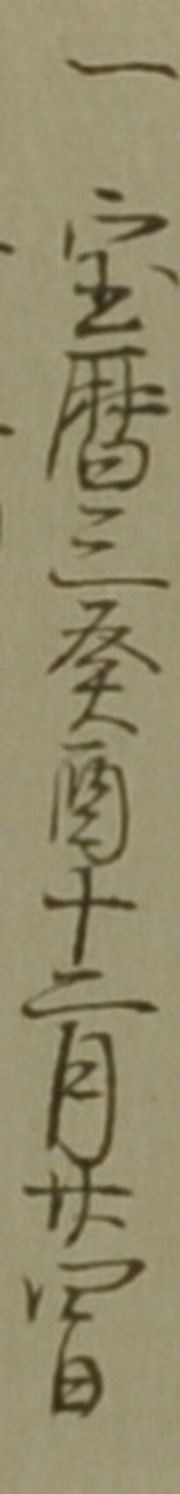一宝暦三癸酉十二月廿四日
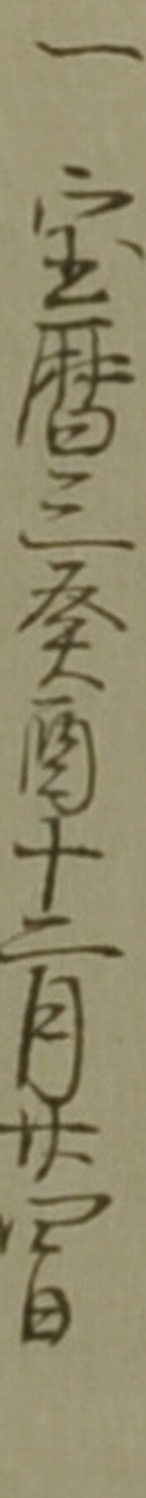一宝暦三癸酉十二月廿四日
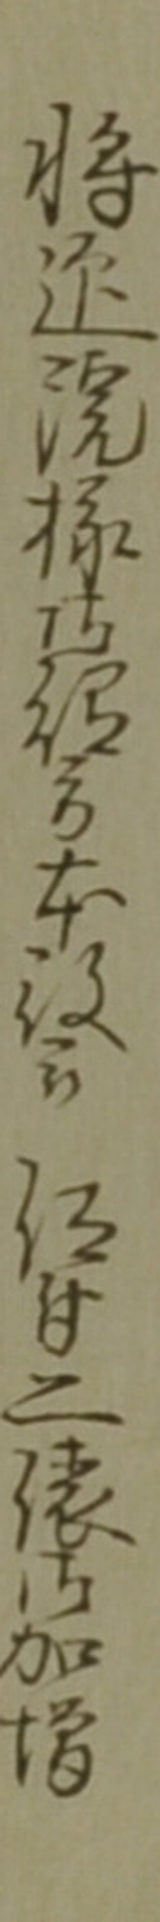将迎院様御賄方本役被仰付二俵御加増
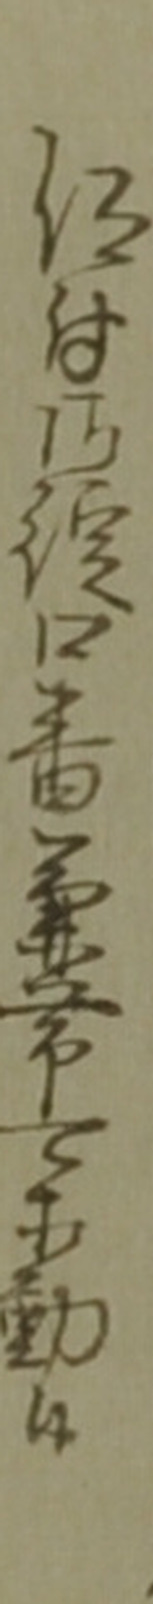仰付御錠口番兼帯可相勤候
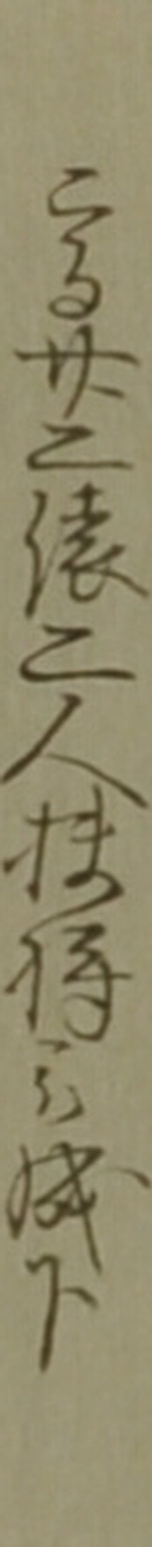高廿二俵二人扶持被成下
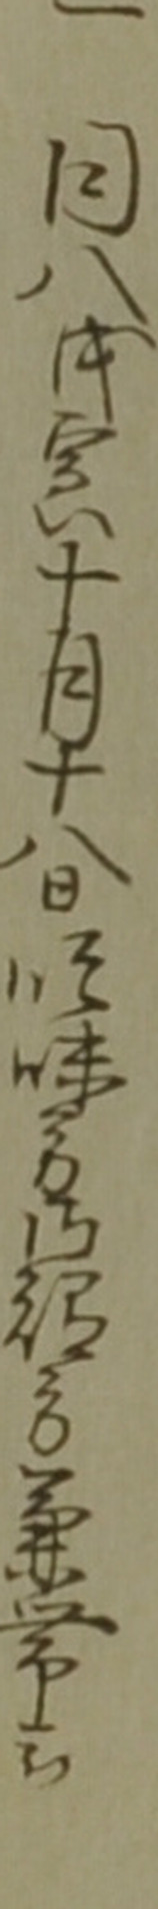一同八戊寅十月十八日吟味方御賄方兼帯被
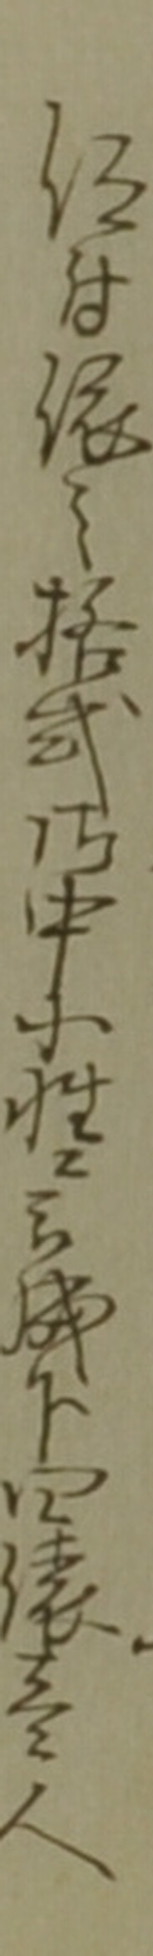仰付依之格式御中小性被成下四俵壱人
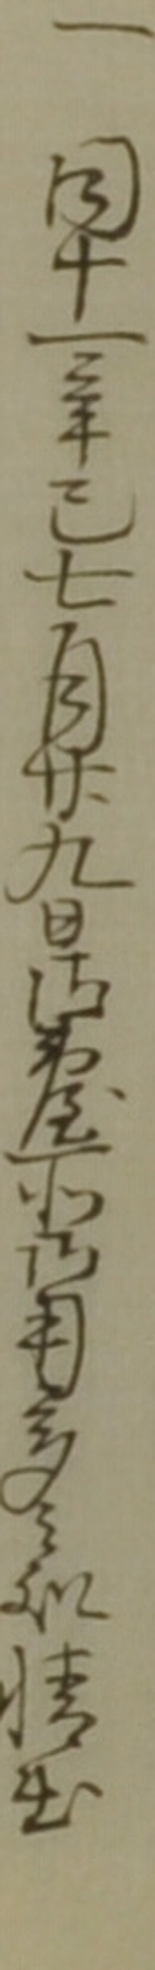一同十一年辛巳七月廿九日御台所御用多之処被情出
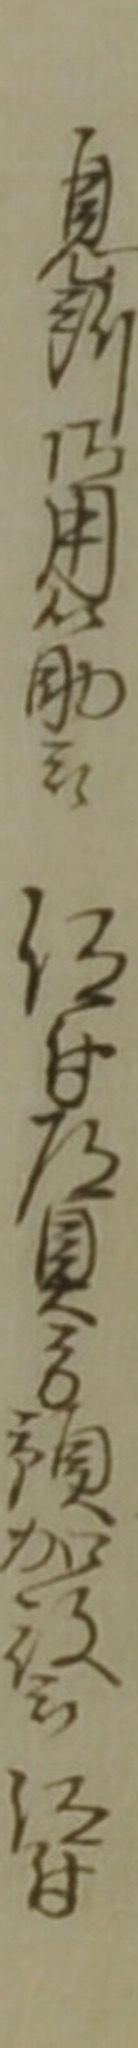息所御用筋被仰付道具方預加役被仰付
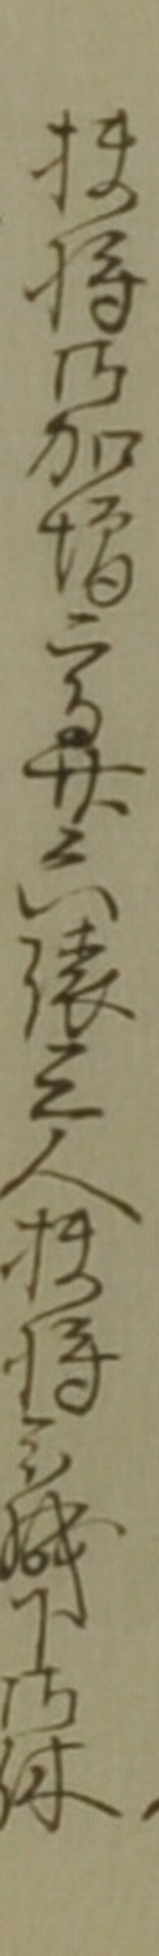扶持御加増高廿六俵三人扶持被成下御休
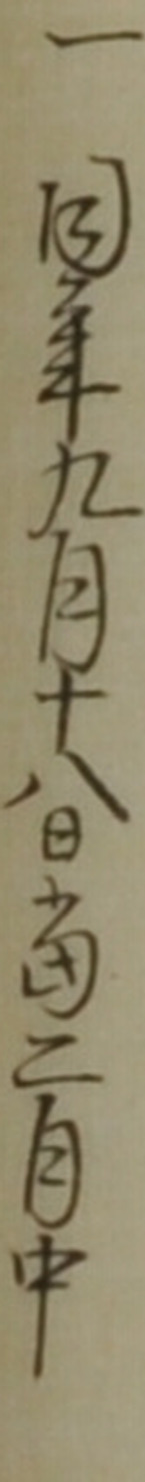一同年九月十八日当二月中
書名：無足廃家（弐）
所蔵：伊那市立高遠町図書館・合同会社AMANE
